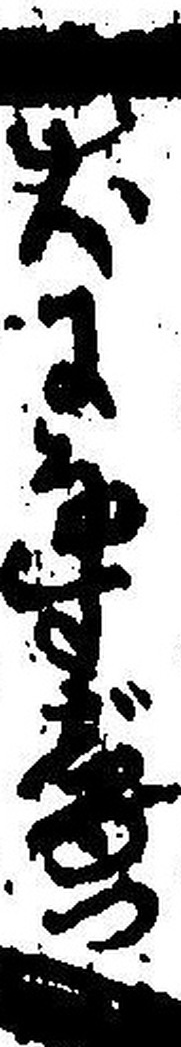犬になすじゆつ
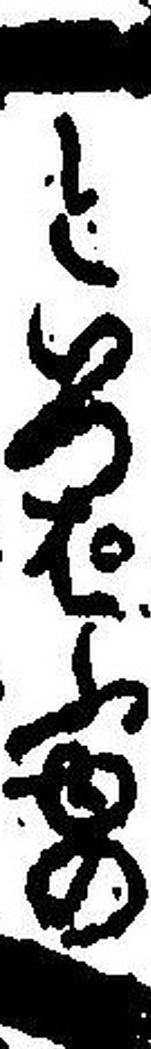といつぱふゆの
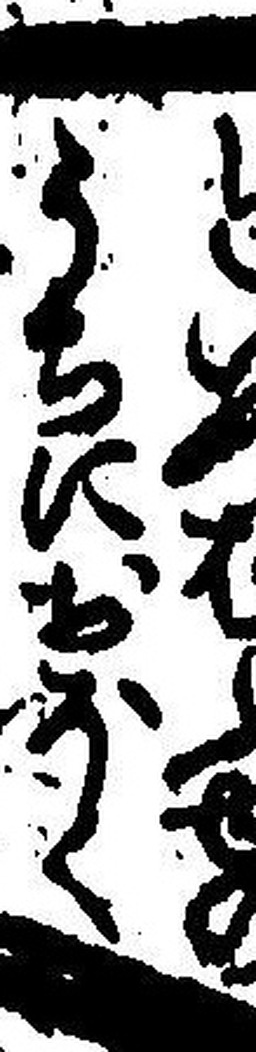うちにおほく
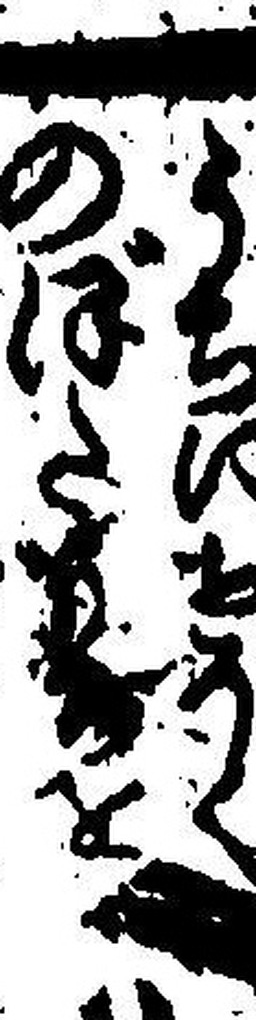のぼたもちを
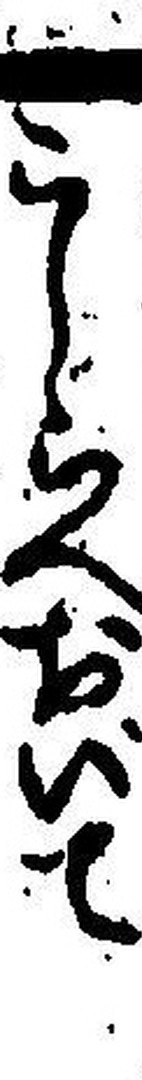こしらへおいて
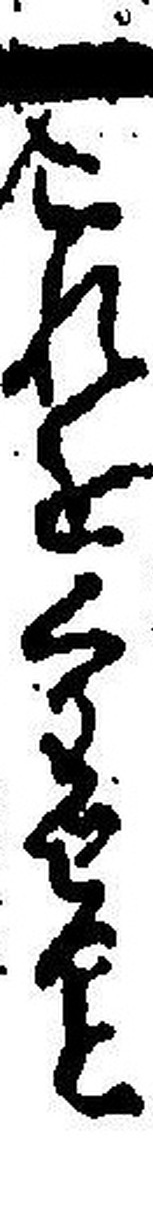これをくわせると
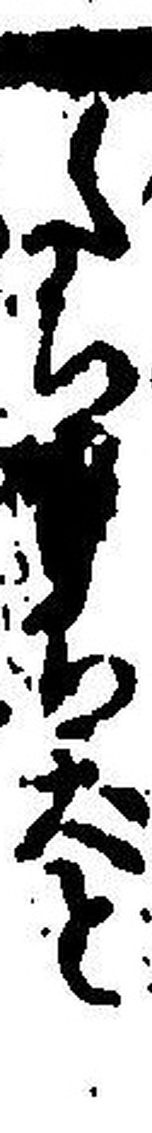たちち犬と
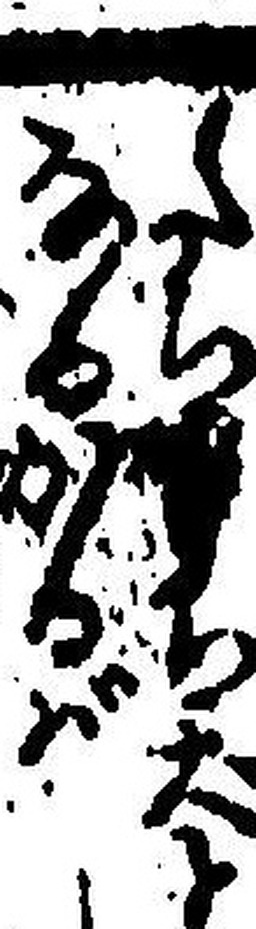なるかるが
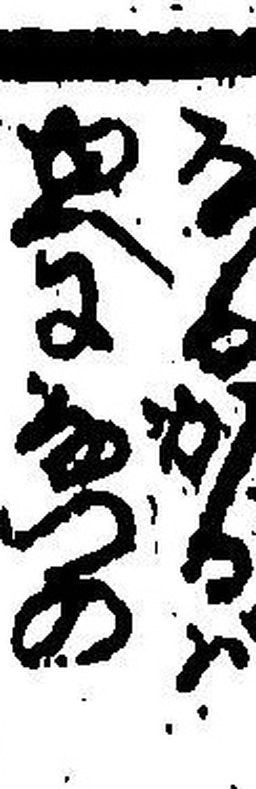ゆへになつの
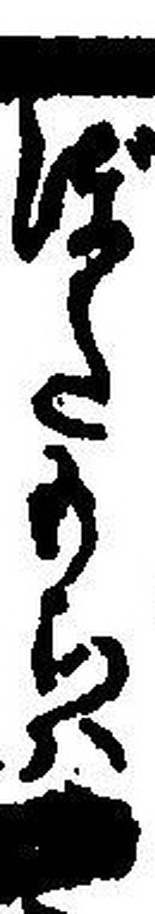ぼたもちは
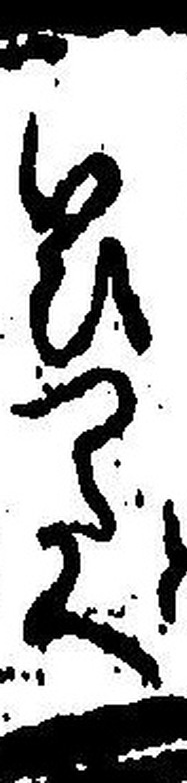いひつたへ
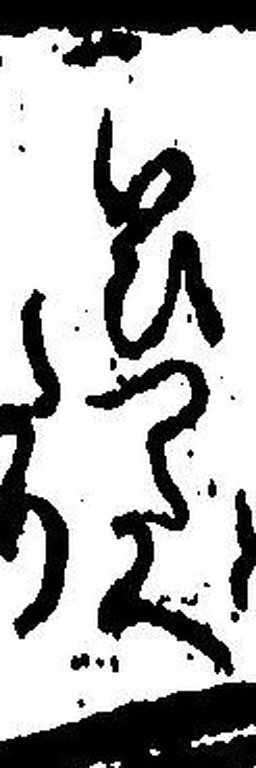いひつたへ

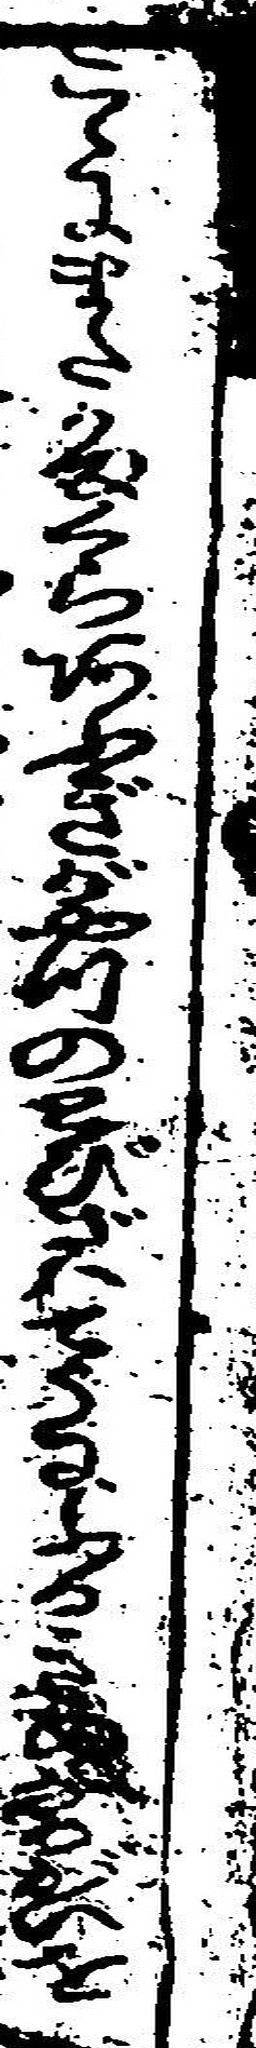ここにまたかまくらあふぎがやつのとひざはてうにふるきのなかがいを
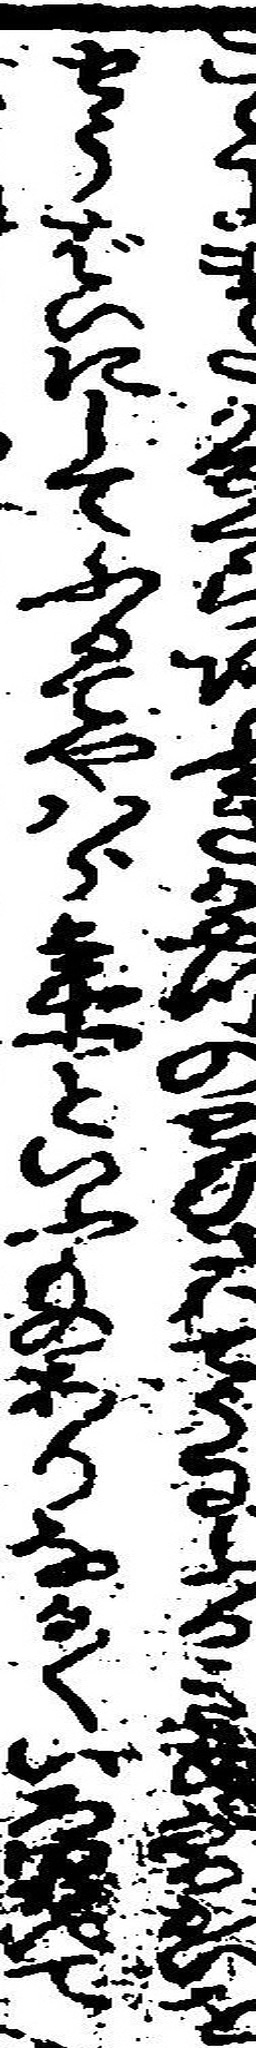せいばいにしてふるてや八郎兵衛といふものありなか〳〵いろ男にて
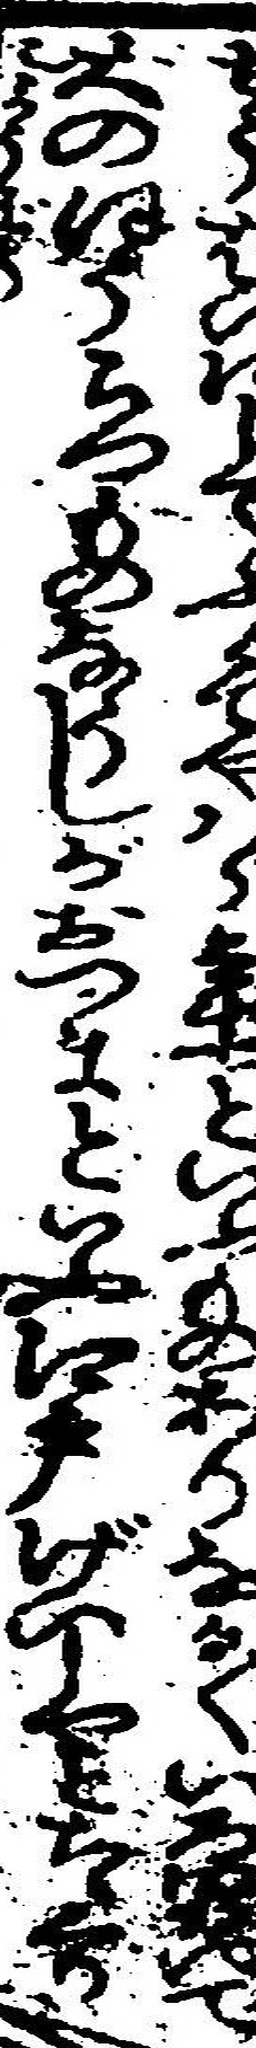大のはうらつものなりしかおつまといふ江戸げいしやとちゝくり
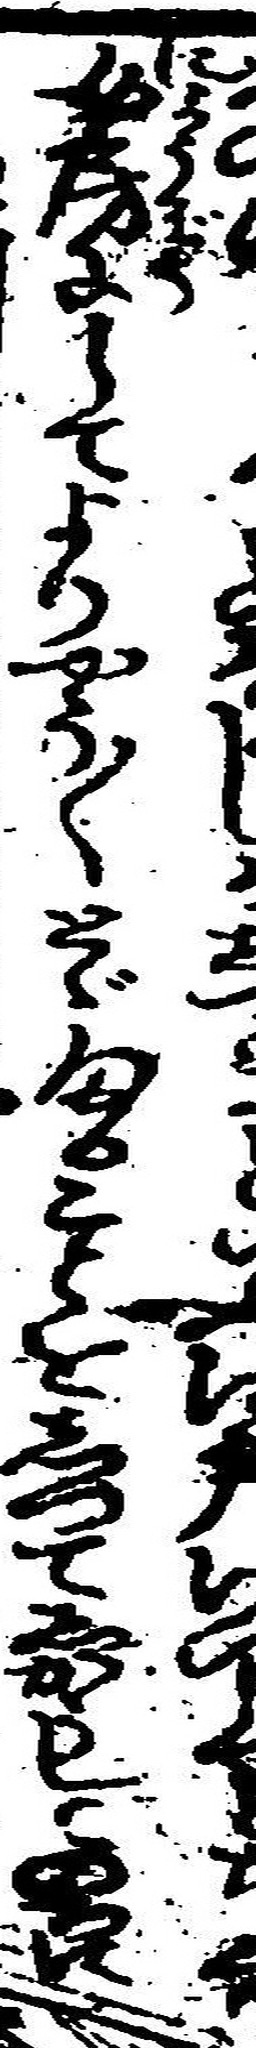女房にしてよりやう〳〵とゞまることをしつてしかうしてのちに
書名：花芳野犬斑 / 山東京伝作
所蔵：東京大学総合図書館 General Library in the University of Tokyo, JAPAN
